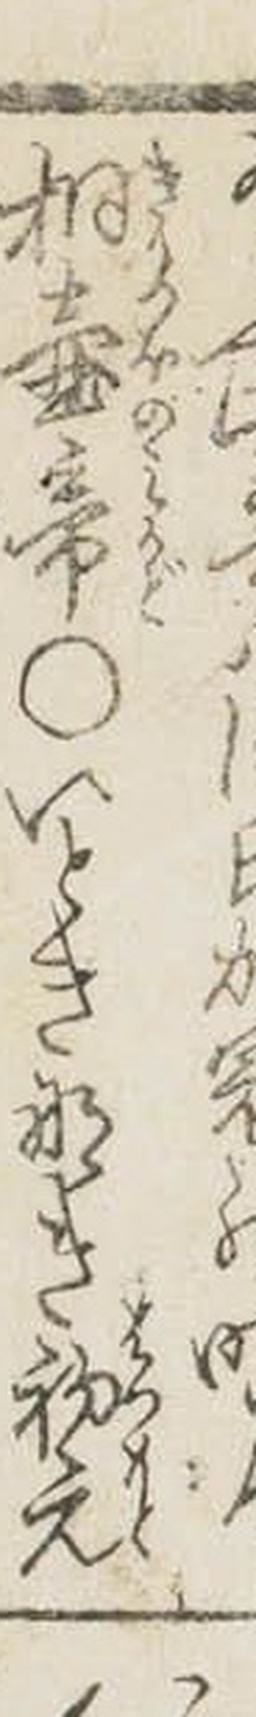桐壺帝○いときなき初元
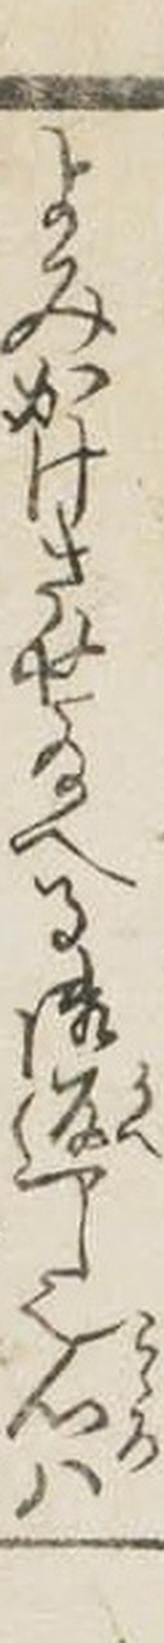よみかけさせ給へる御返し也心は
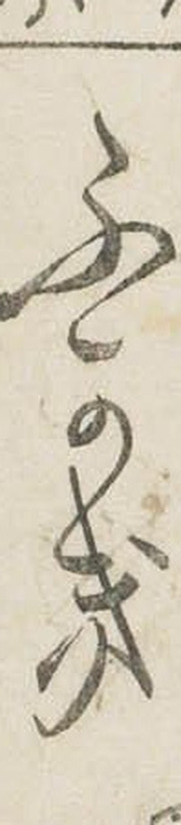ふかき
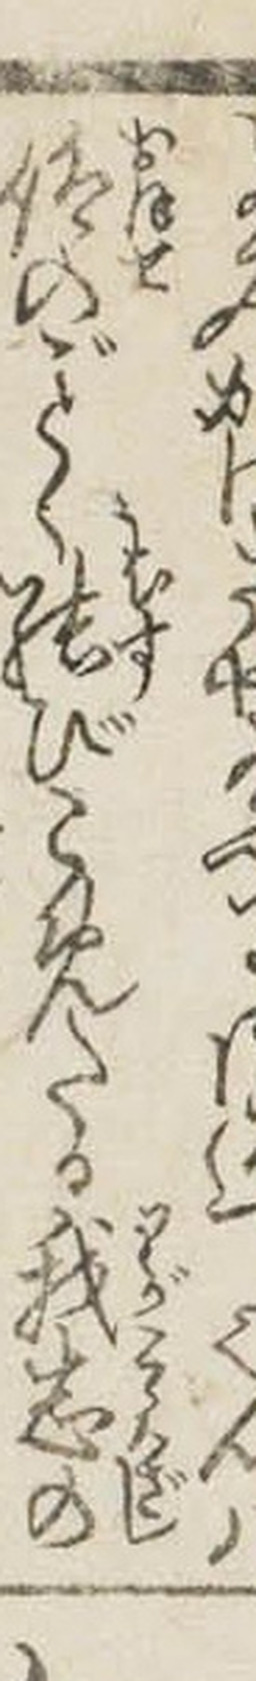仰のごとく結びこめたる我志の
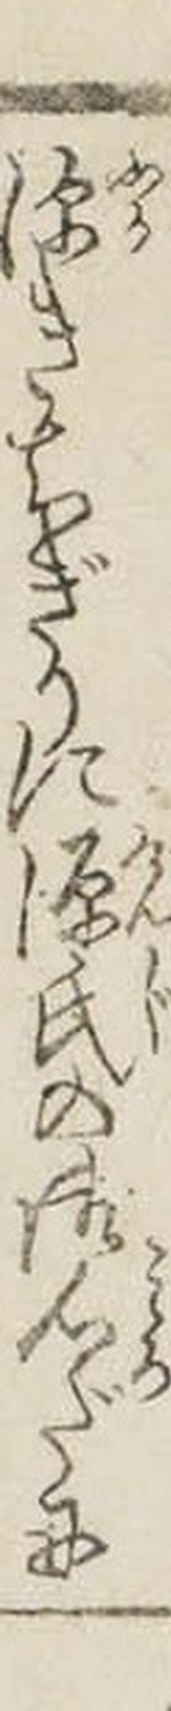深きちぎりに源氏の御心だに
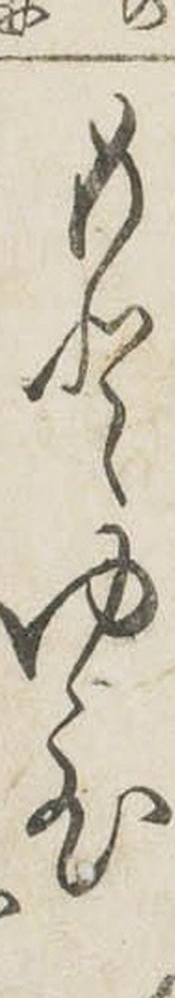もとゆひ
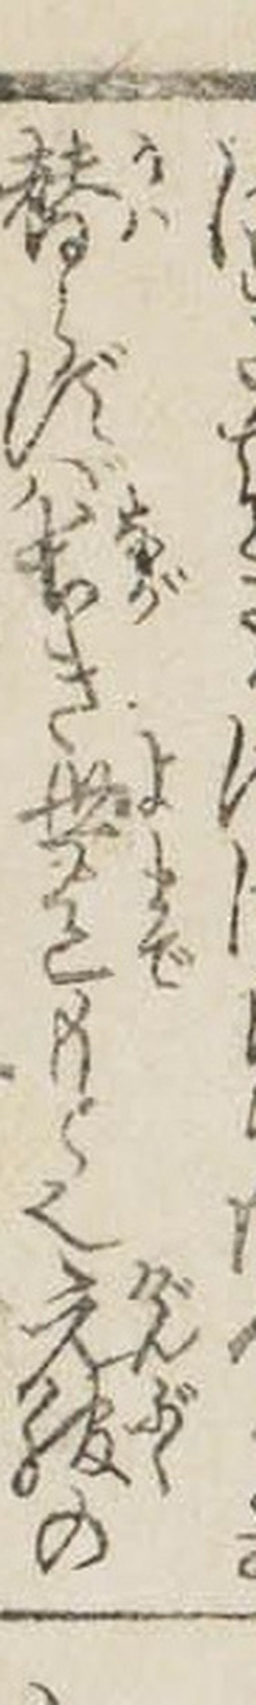替らずば長き世迄もと也元服の
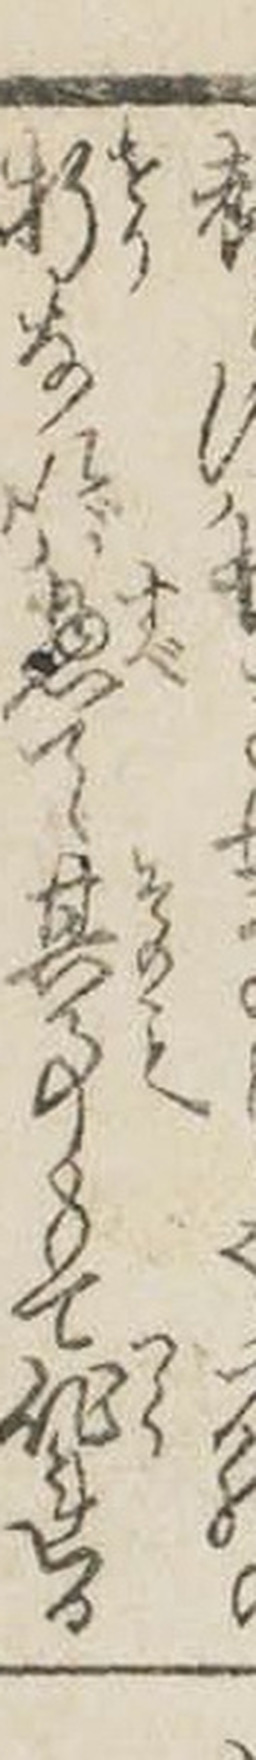折なれば総て其事もて作れる
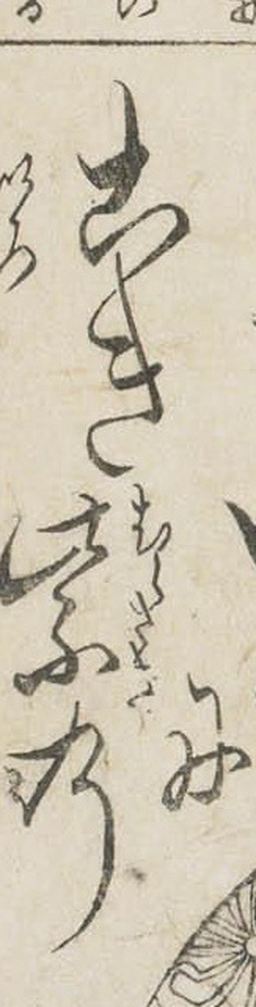こき紫の
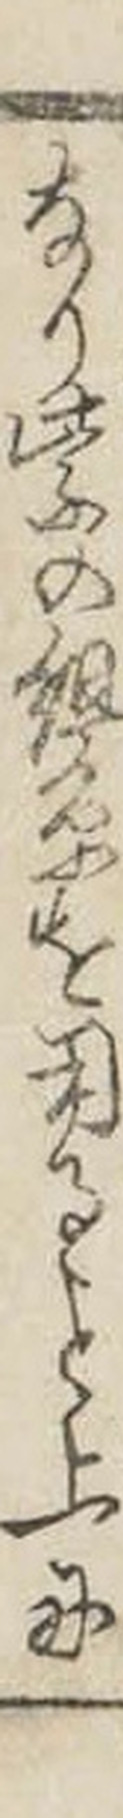なり紫の組糸を用ること上に
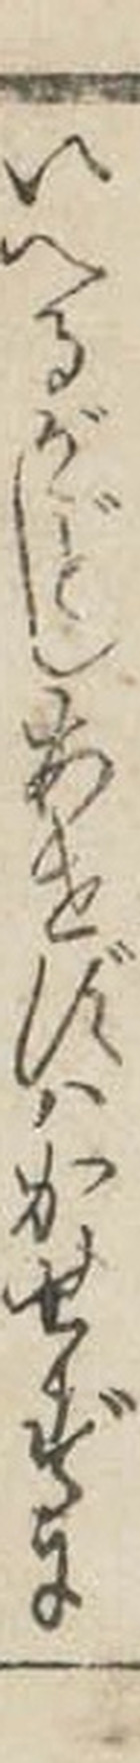いへるがごとしあせずはかせずに
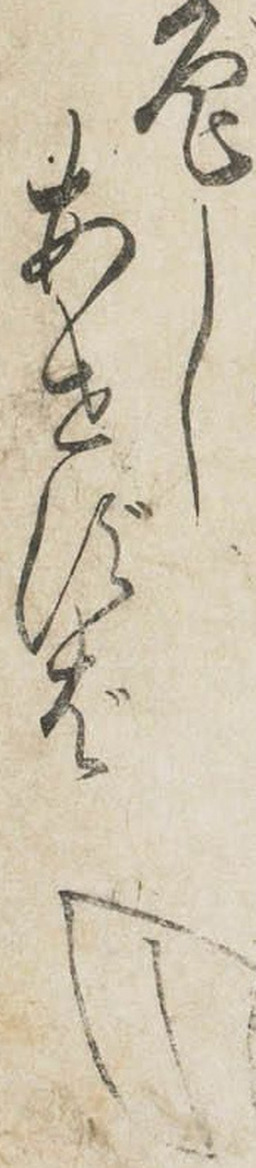あせずば
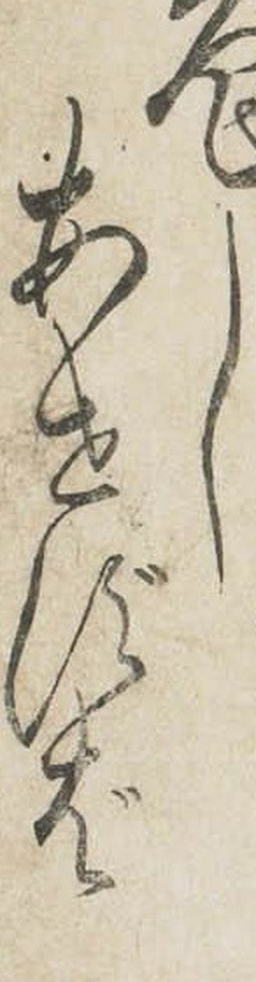あせずば

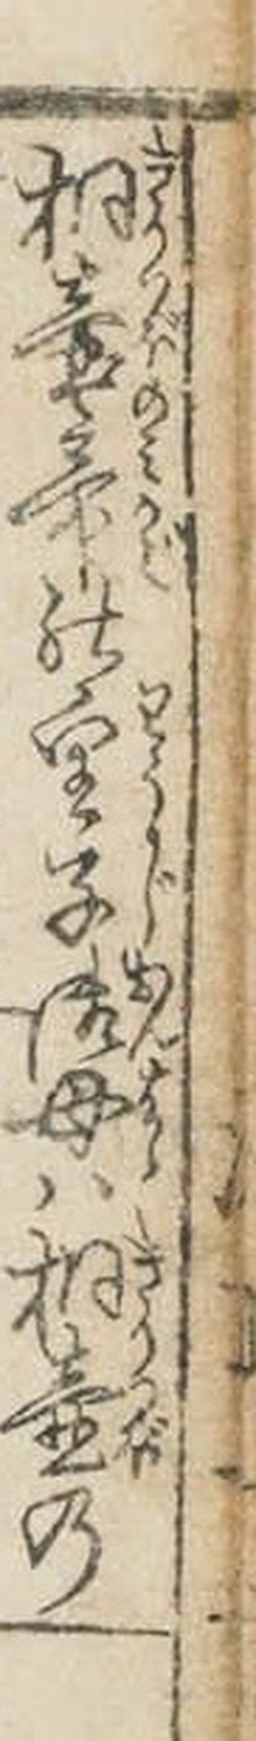桐壺帝の皇子御母は桐壺の
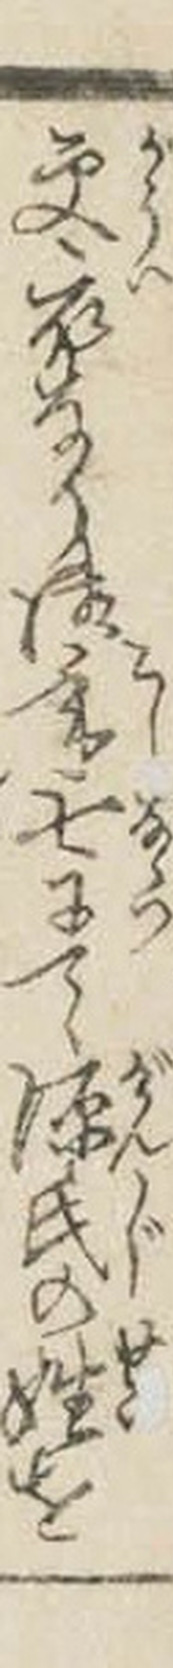更衣なり御年七にて源氏の姓を
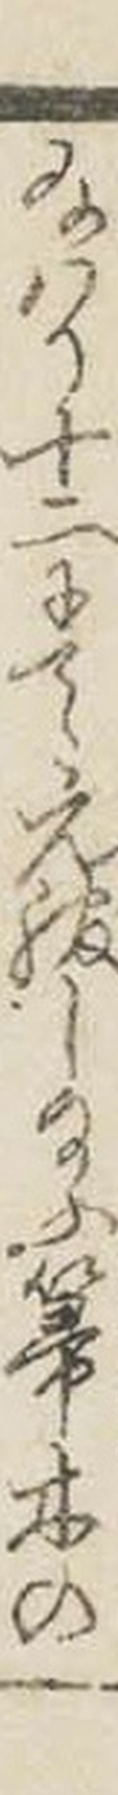給はり十二にて元服し給ふ帚木の
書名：源氏百人一首
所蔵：東京学芸大学教育コンテンツアーカイブ
